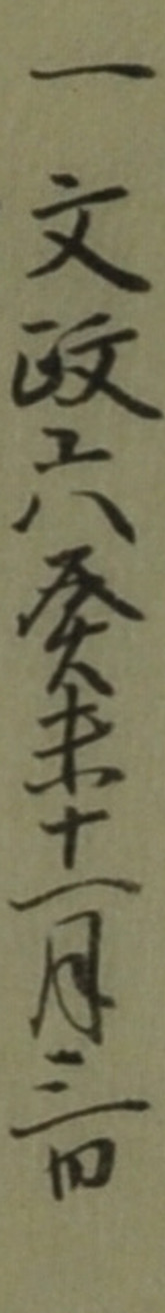一文政六癸未十一月三日
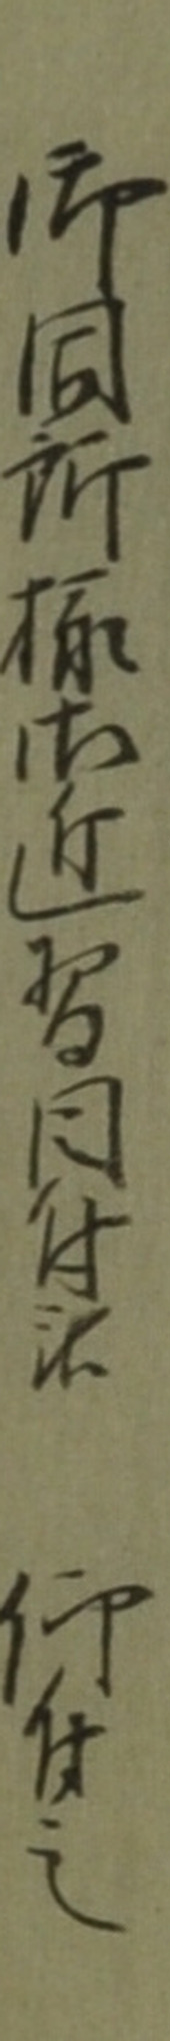御同所様御近習目付被仰付之
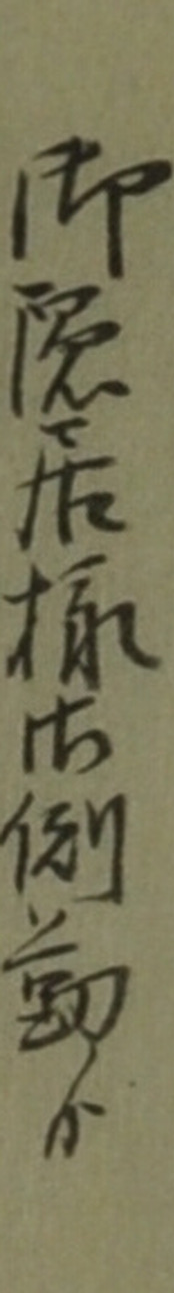御隠居様御側勤ゟ
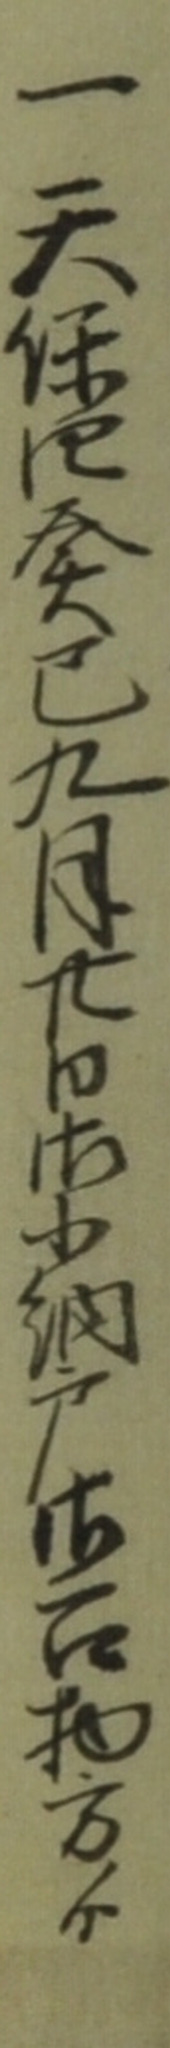一天保四癸巳九月廿日御小納戸御召物方ゟ
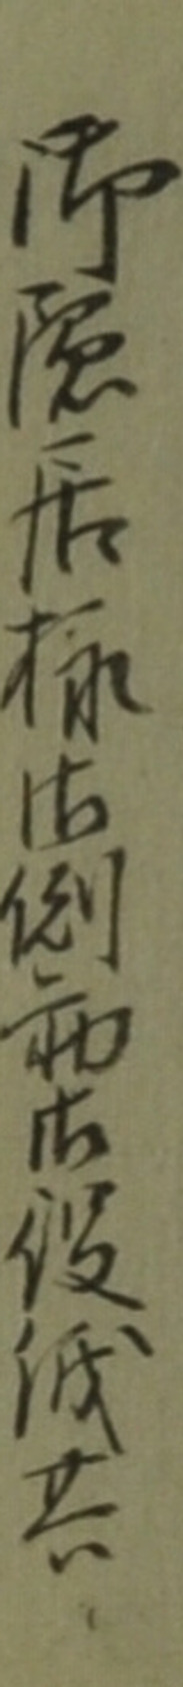御隠居様御側勤御役儀共
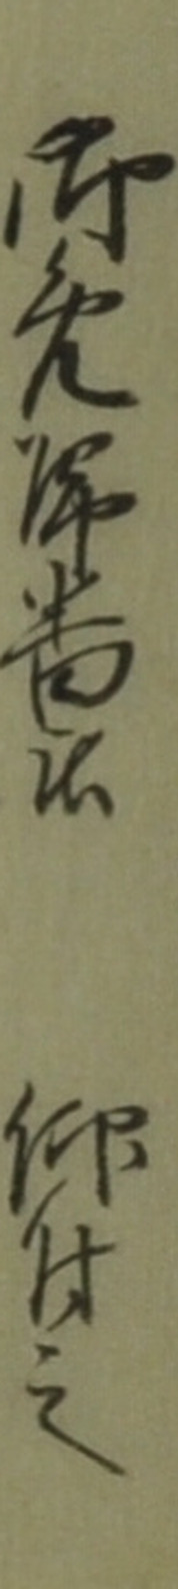御免帰番被仰付之

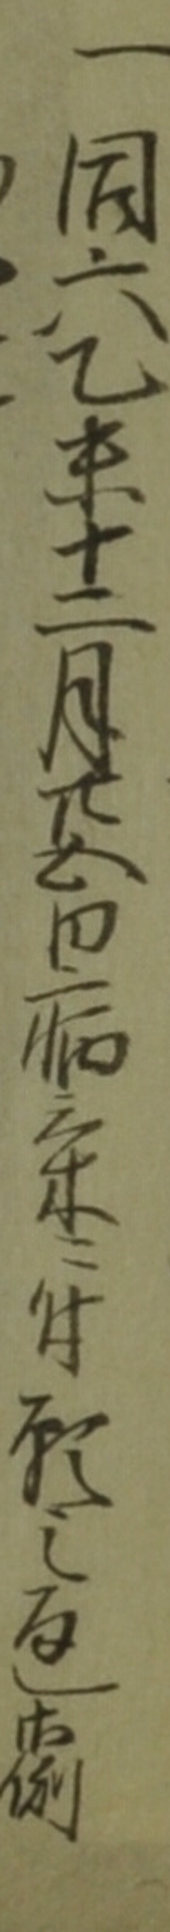一同六乙未十二月廿五日病気にニ付願之通御側
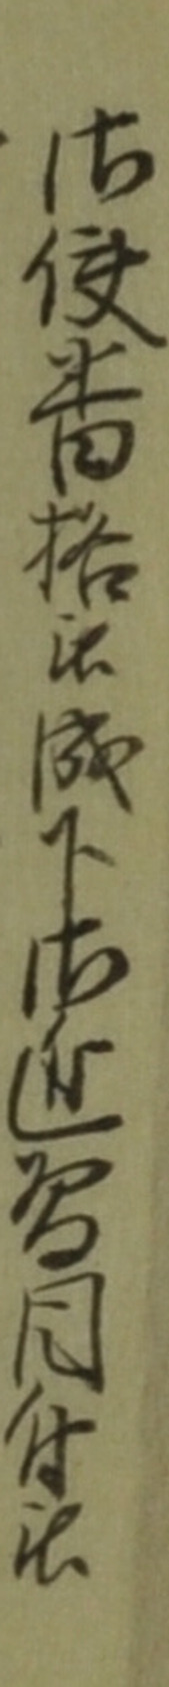御使番格被成下御近習目付被
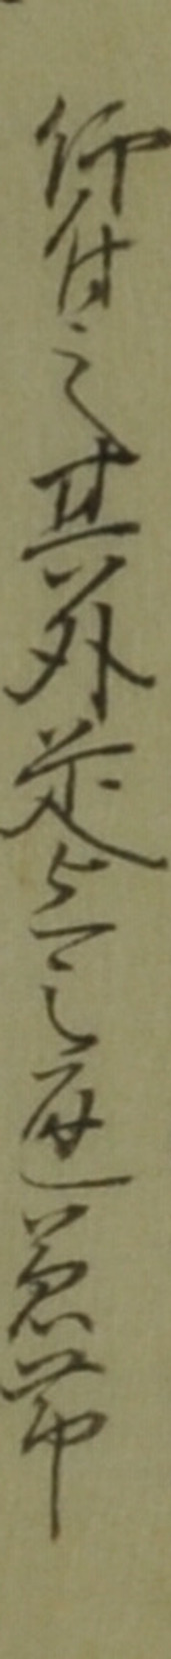仰付之其外是迄之通兼帯
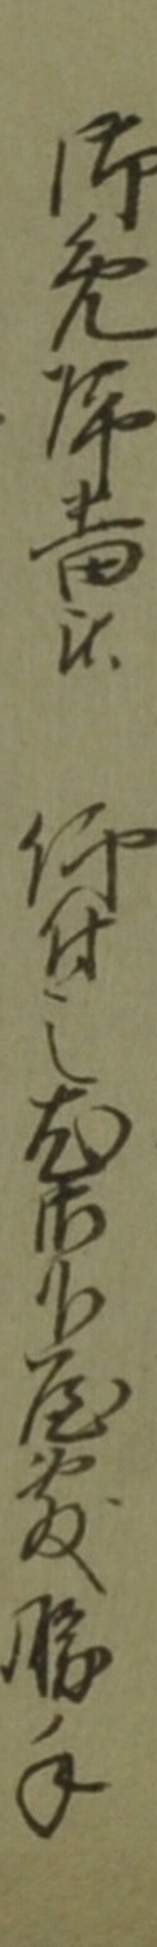御免帰番被仰付之尤御下屋敷勝手
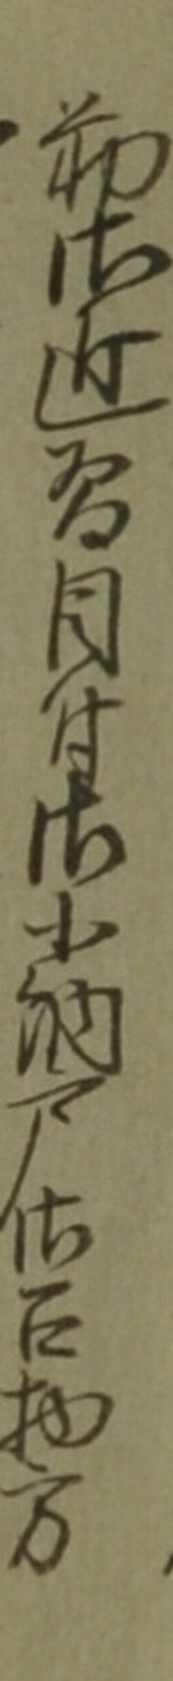勤御近習目付御小納戸御召物方
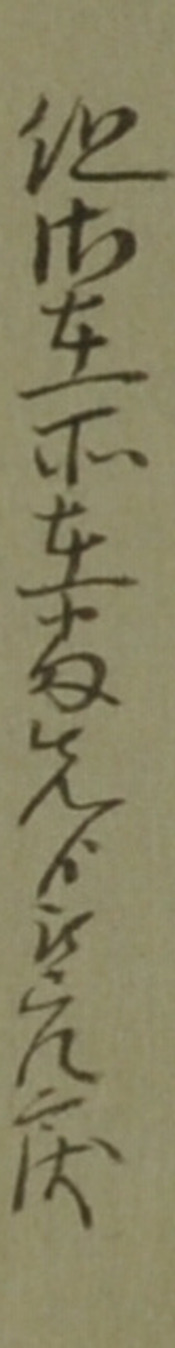但御在所在番先ゟ被差戻
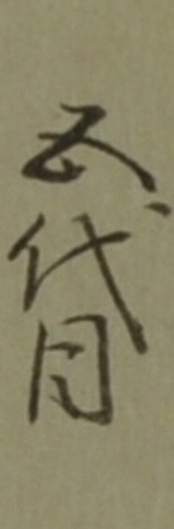五代目
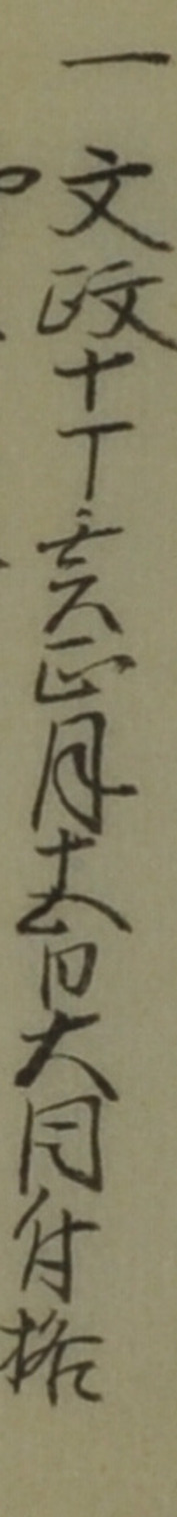一文政十丁亥正月十五日大目付格
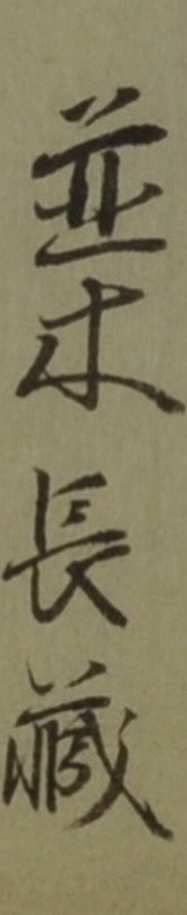並木長蔵
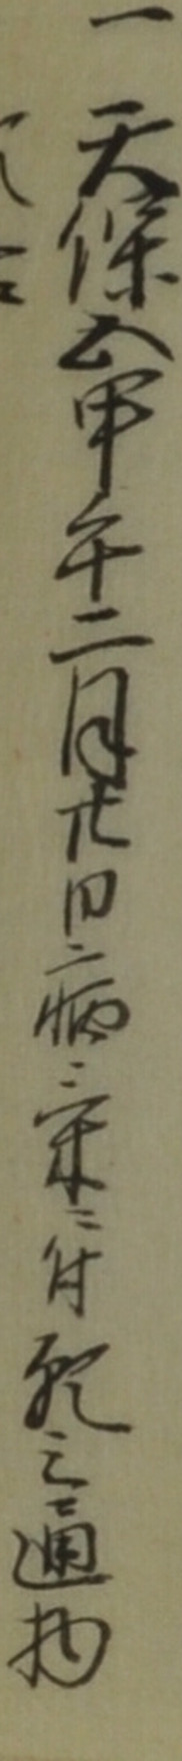一天保五甲午二月廿日病気ニ付願之通物
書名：諸御役代々録（四）
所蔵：伊那市立高遠町図書館・合同会社AMANE
